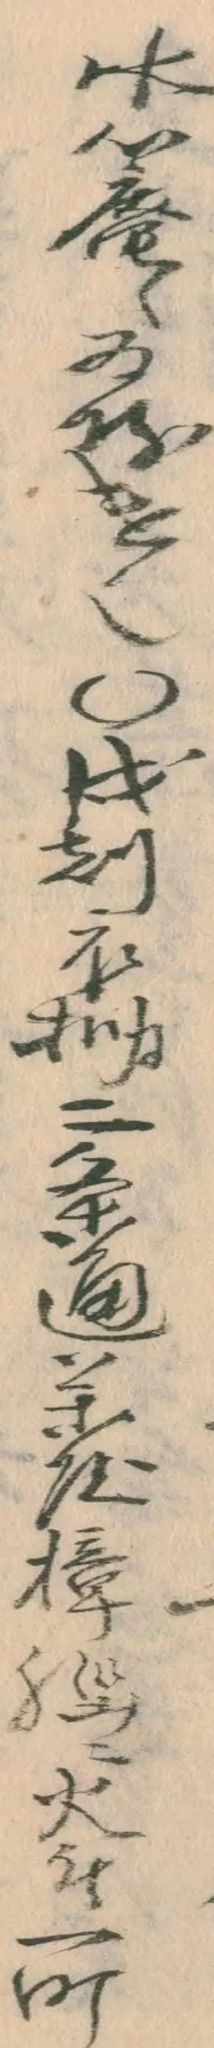水心庵へ為持遣也○戌刻衣棚二条通茶屋樟脳ニ火付一町
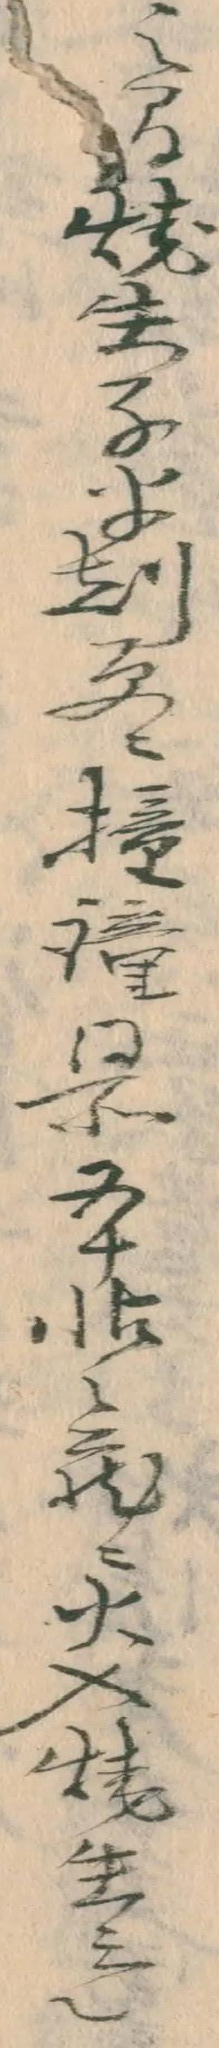之間焼失子半刻更ニ撞鐘同所五十帖之蔵に火入焼失云々
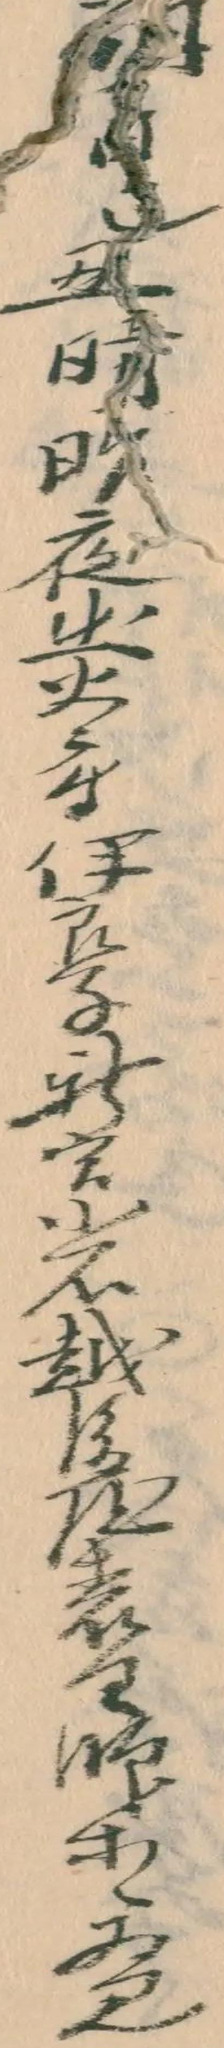朔日己丑晴昨夜出火ニ付伊良子新宮小石越後屋表具師等へ為見
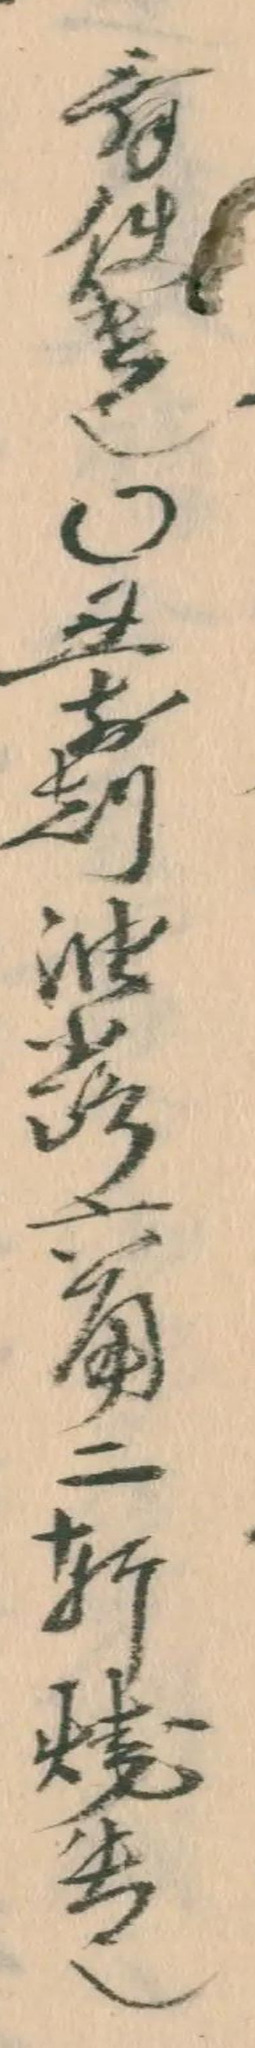舞使遣也○丑前刻油小路六角二軒焼失也
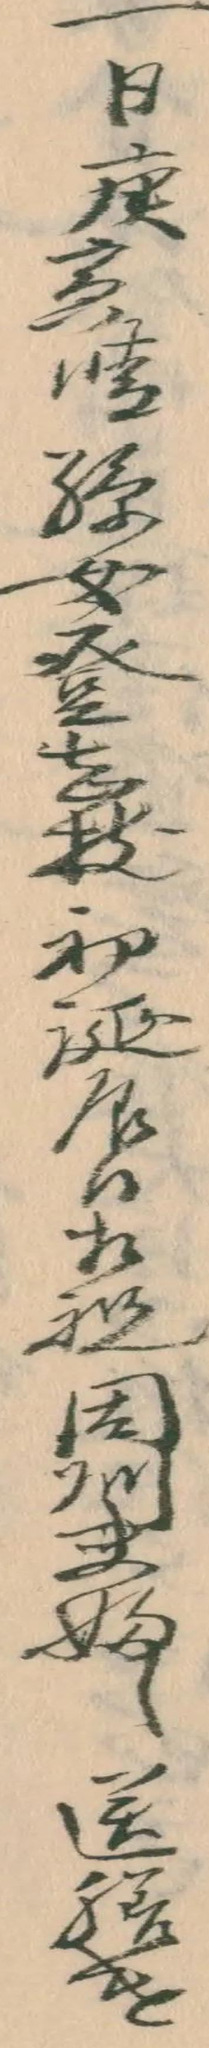二日庚寅晴孫女登志枝初誕辰候相祝因州夫婦ヘ送膳遣
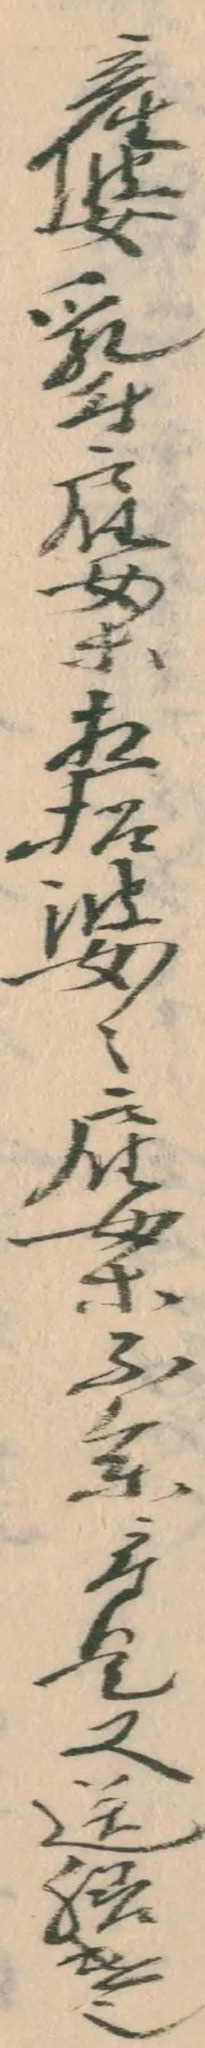産婆乳付雇女等相招婆之雇女等不参ニ付是又送膳遣也
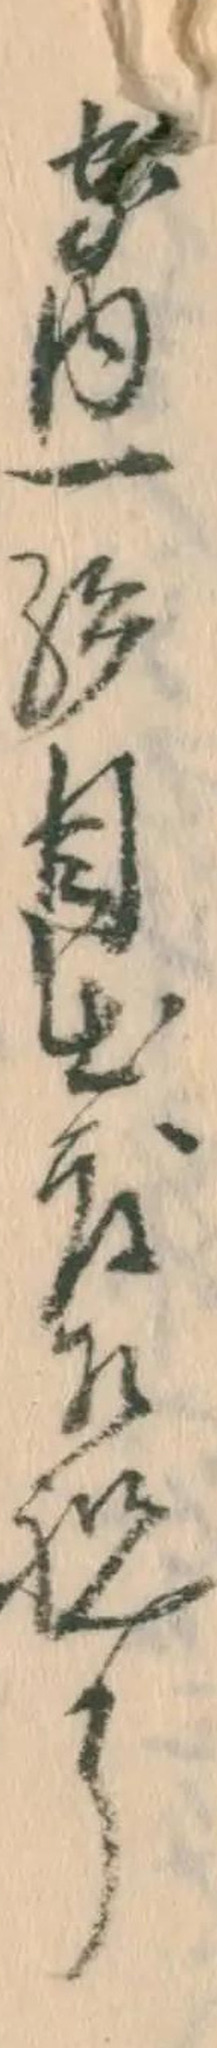家内一統目出度相祝了
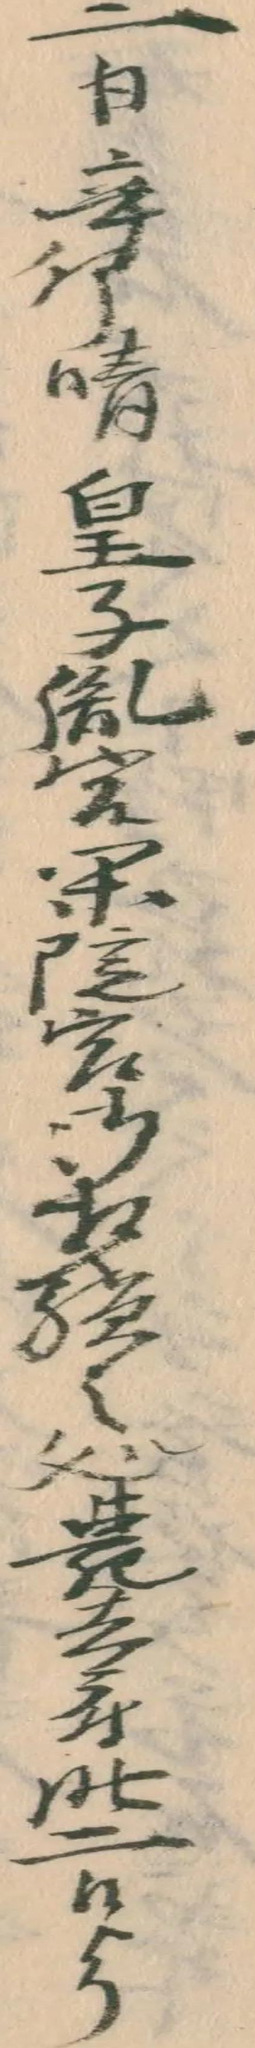三日辛卯晴皇子胤院閑院宮御相續之処薨去ニ付昨二日より
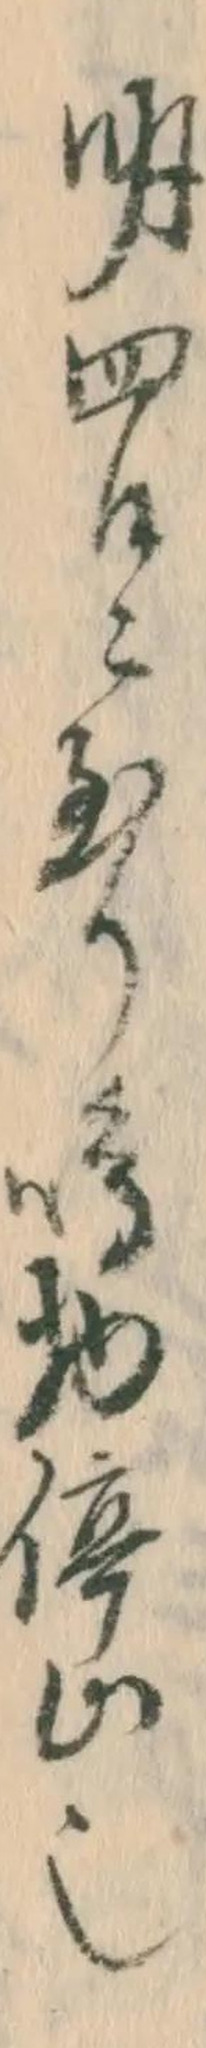明四日に至り鳴物停止也
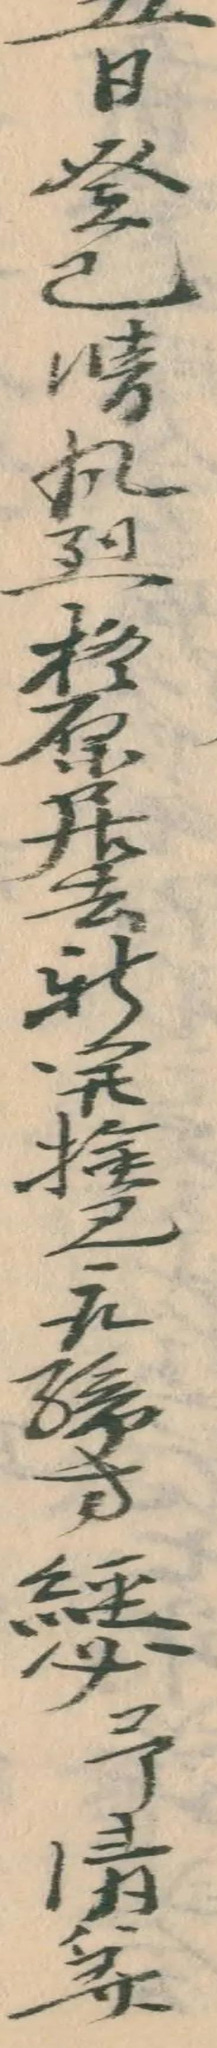五日癸巳晴風烈柊原居去新開検見取締方経必予清算
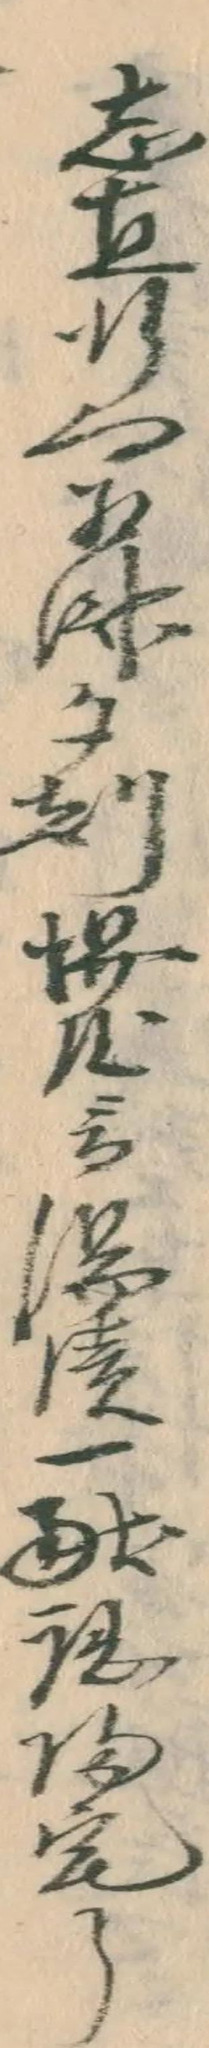志直行向相済夕刻堺屋ニ而湯漬一献認帰宅了
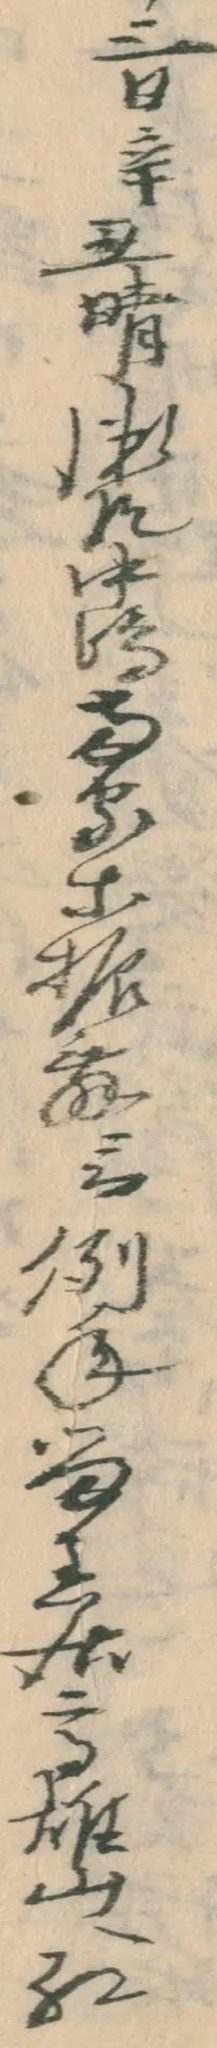十三日辛丑晴瀬尾中嶋両家等振舞ニ而例年留守居高雄山へ紅
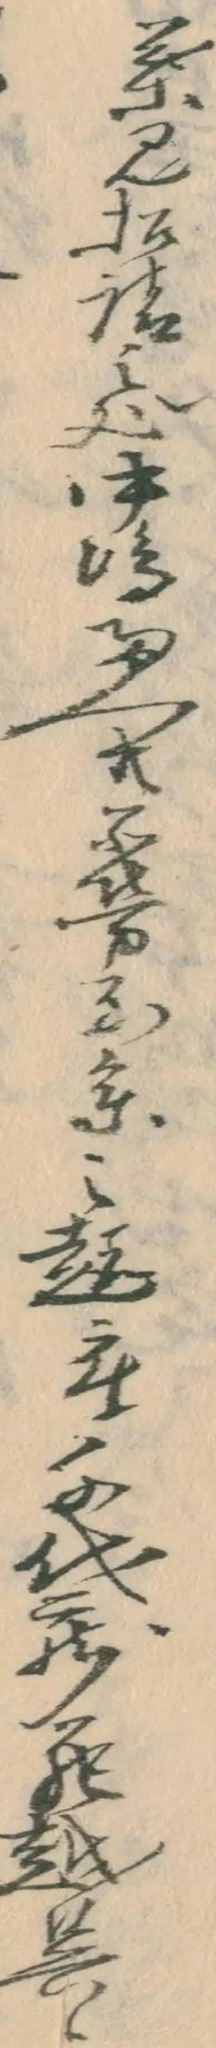葉見招請候処中嶋両人共所労不参之趣ニ付千代蔵罷越呉候
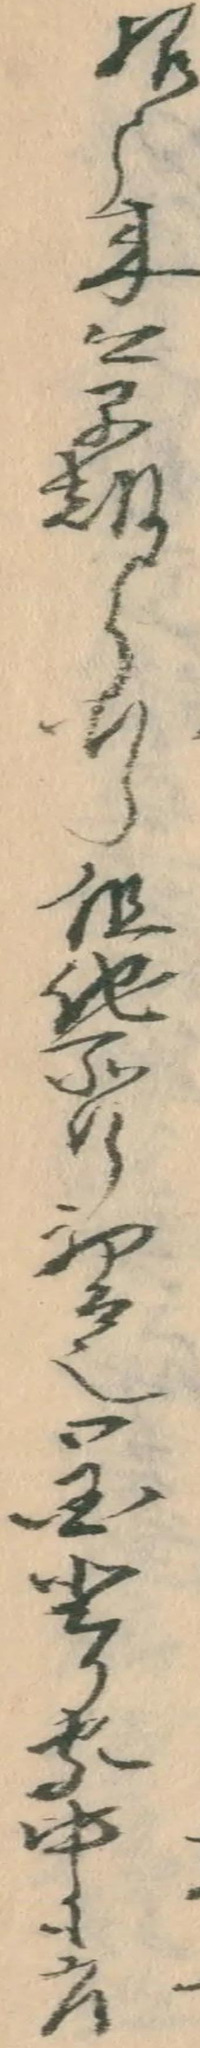様申来今早朝より行但他所行初而也御国登り家中も有

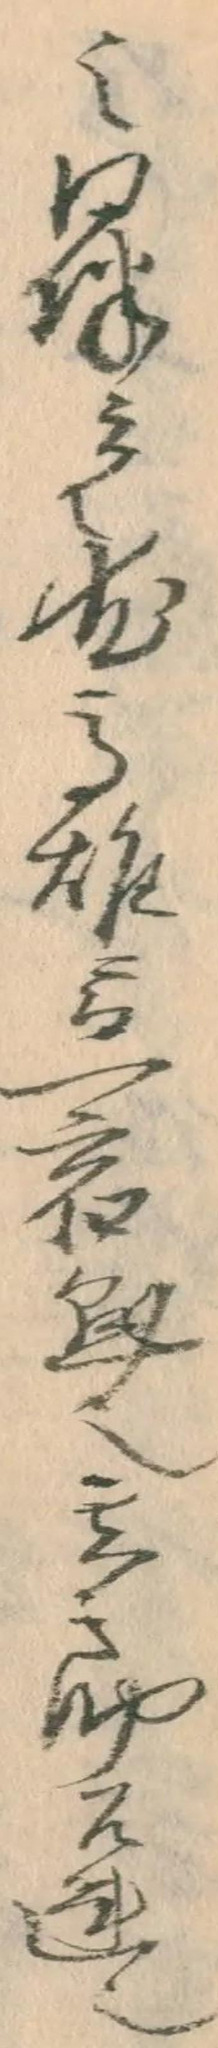之同伴ニて尤高雄ニ而一宿懸也亥之助召連也
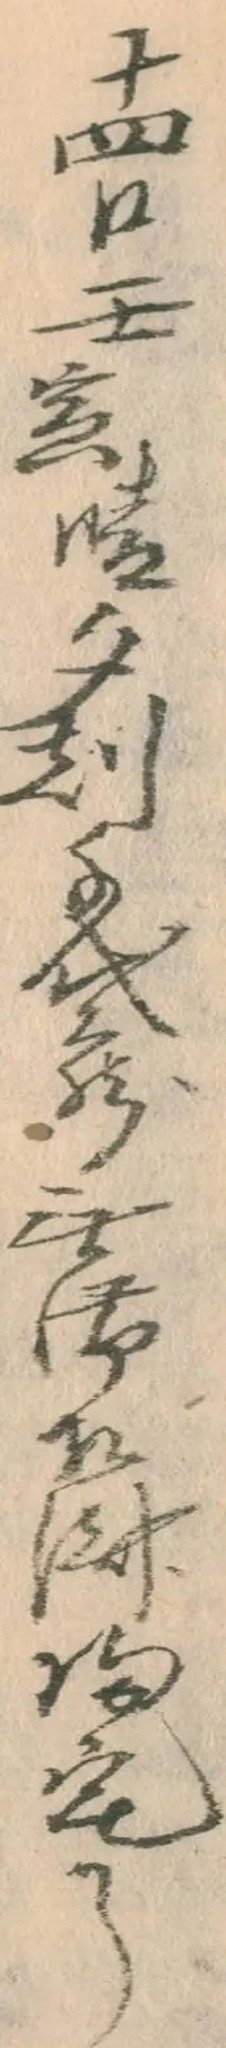十四日壬寅晴夕刻千代蔵無滞相済帰宅了
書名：賀茂社記録. 第70冊
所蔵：国立国会図書館 National Diet Library, JAPAN
